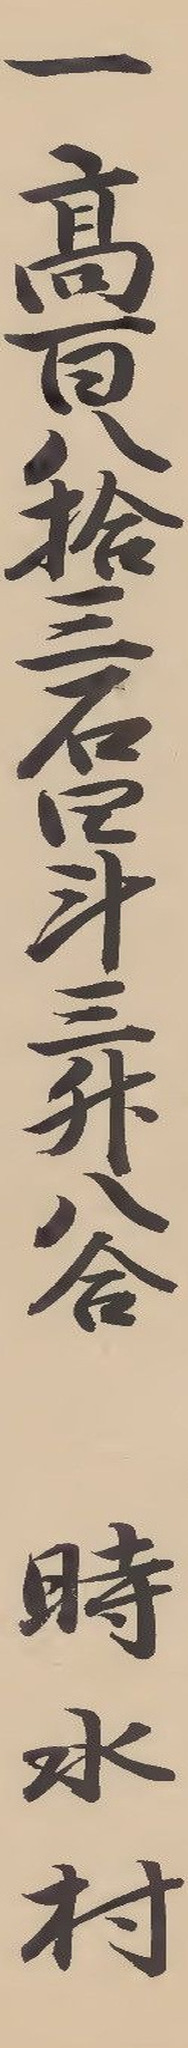一高百八拾三石四斗三升八合時水村
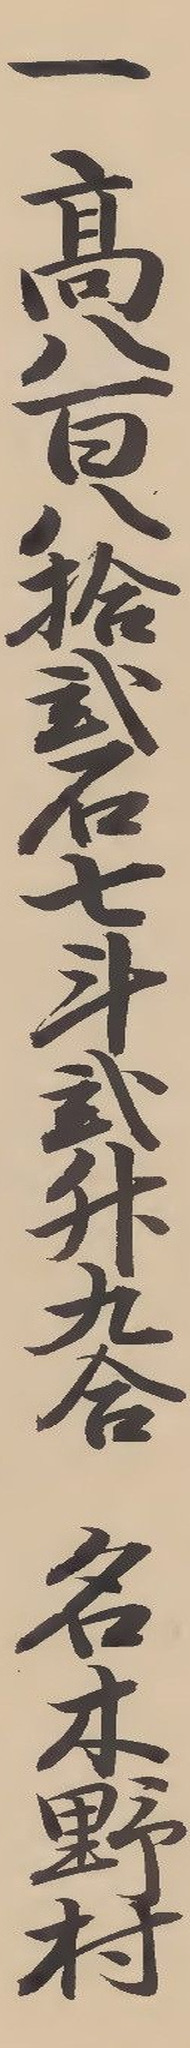一高八百八拾弐石七斗弐升九合名木野村
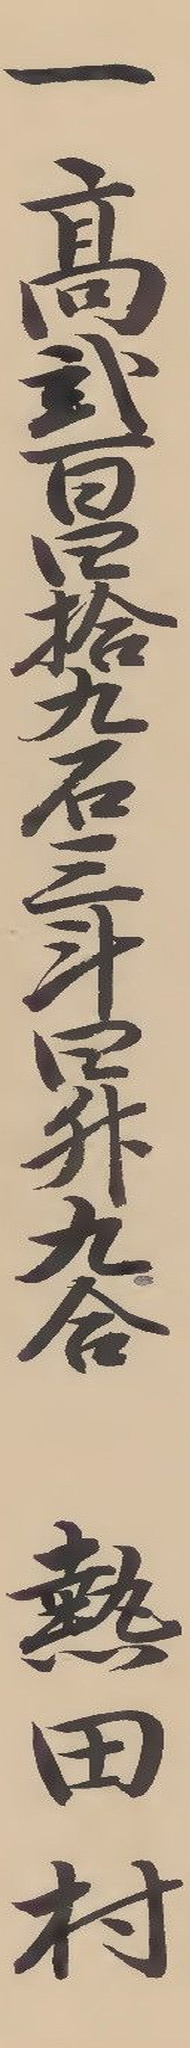一高弐百四拾九石三斗四升九合熱田村

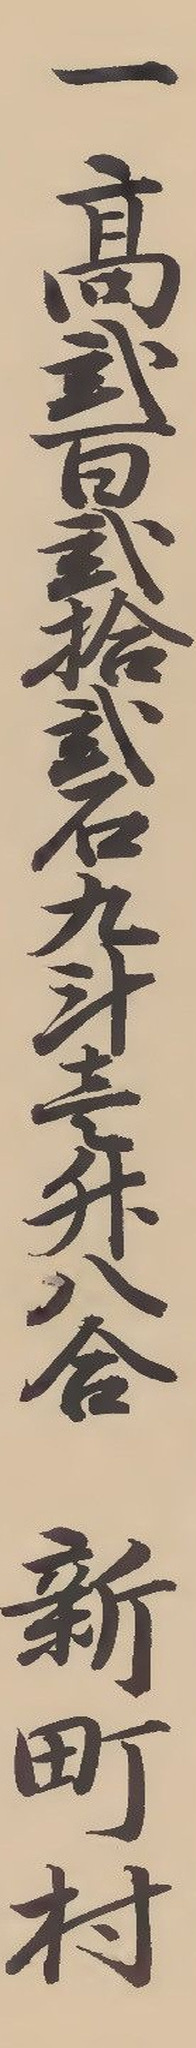一高弐百弐拾弐石九斗壱升八合新町村
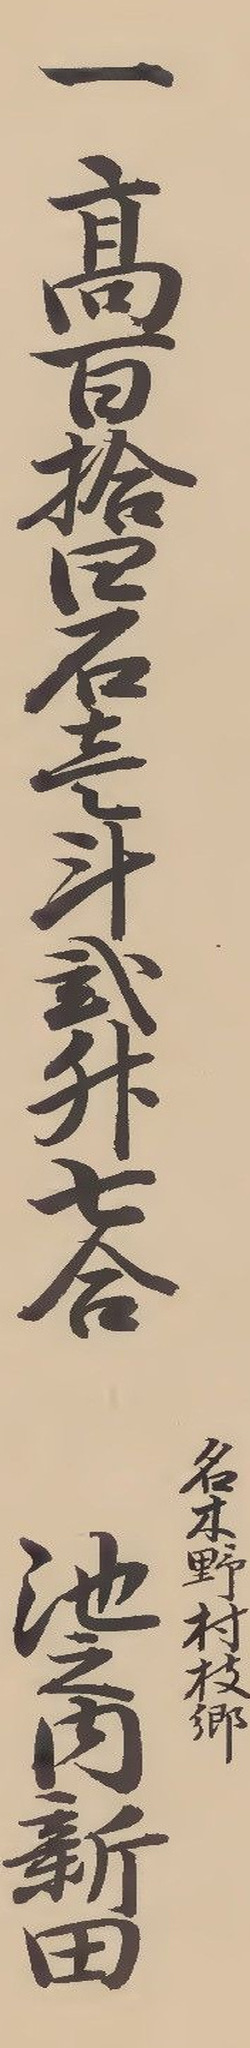一高百拾四石壱斗弐升七合池之内新田
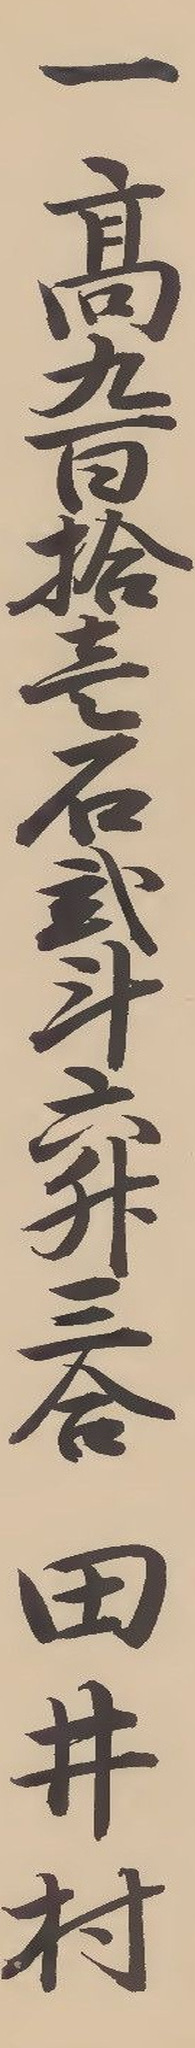一高九百拾壱石弐斗六升三合田井村
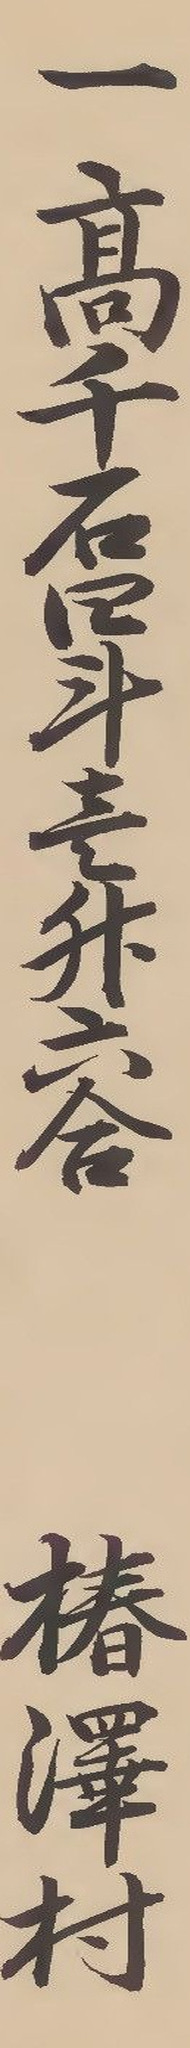一高千石四斗壱升六合椿沢村
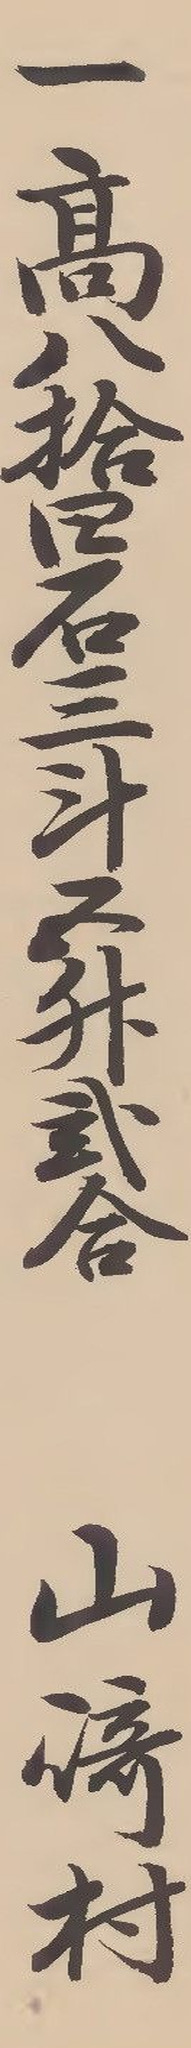一高八拾四石三斗五升弐合山崎村
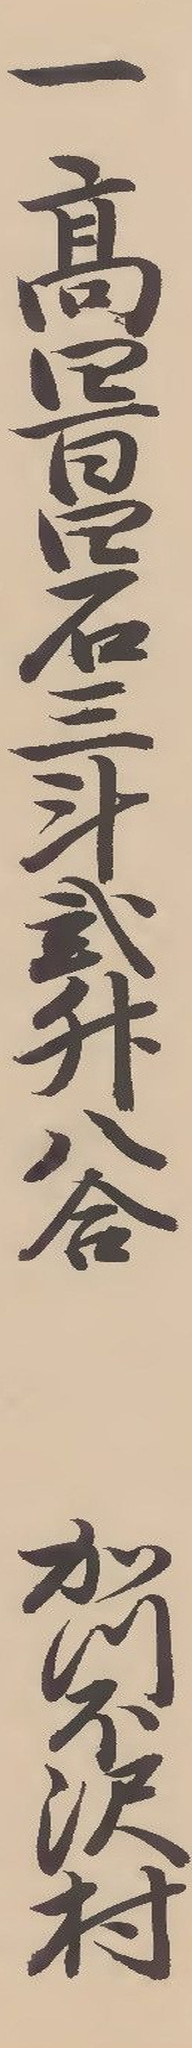一高四百四石三斗弐升八合かつほ沢村
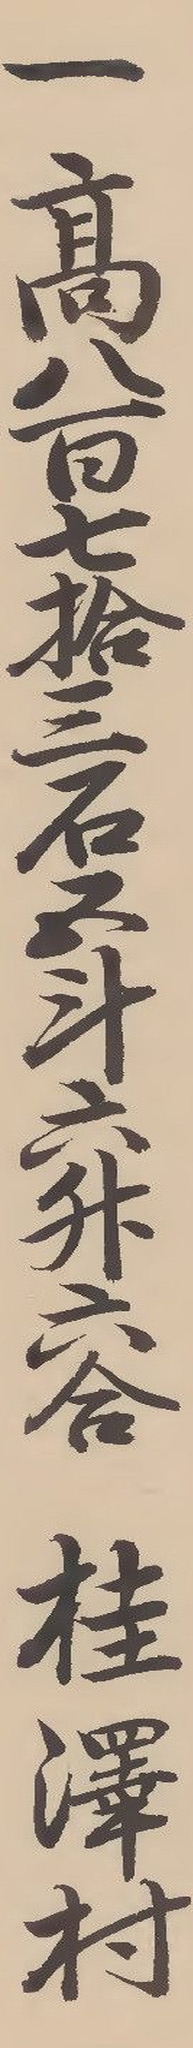一高八百七拾三石五斗六升六合桂沢村
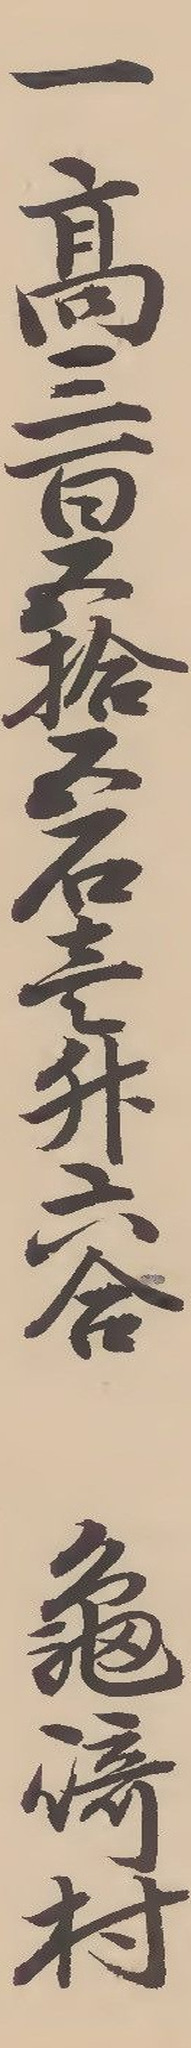一高三百五拾五石壱升六合亀崎村

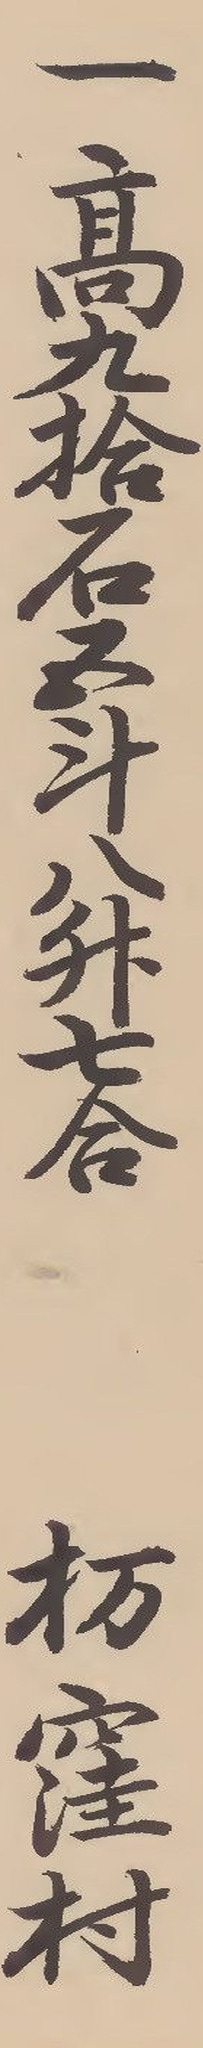一高九拾石五斗八升七合栃窪村
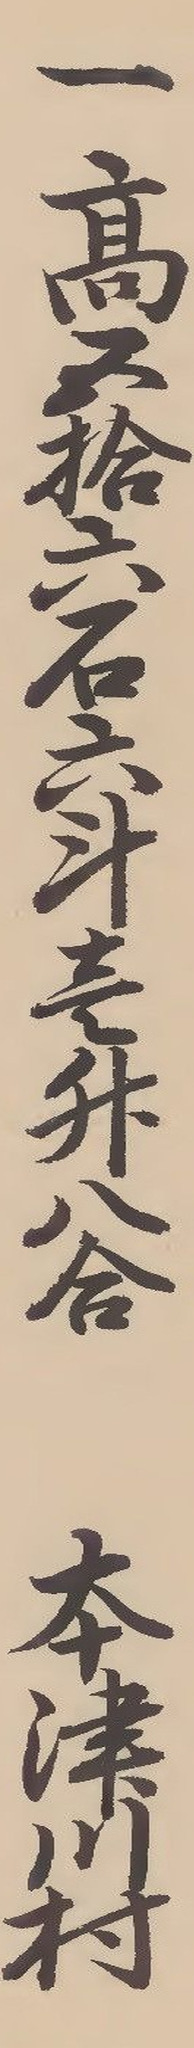一高五拾六石六斗壱升八合本津川村
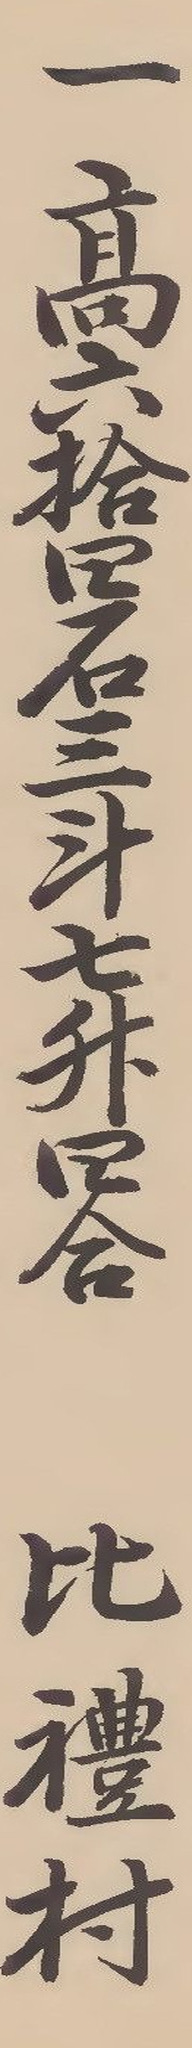一高六拾四石三斗七升四合比礼村
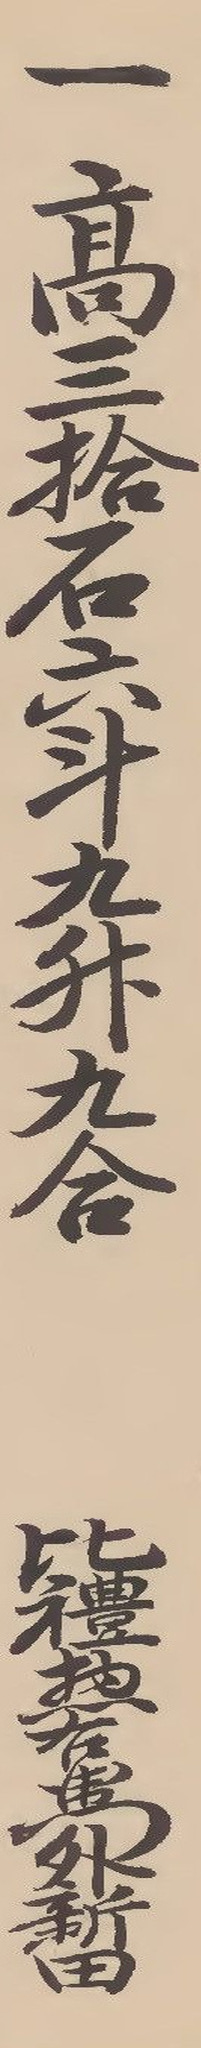一高三拾石六斗九升九合比礼惣右衛門外新田
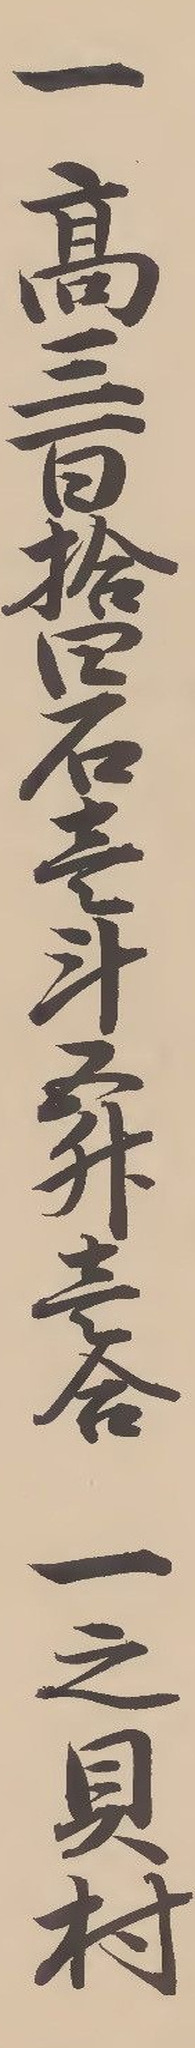一高三百拾四石壱斗五升壱合一之貝村
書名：越後国郷帳　中
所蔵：国立公文書館 National Archives of Japan
